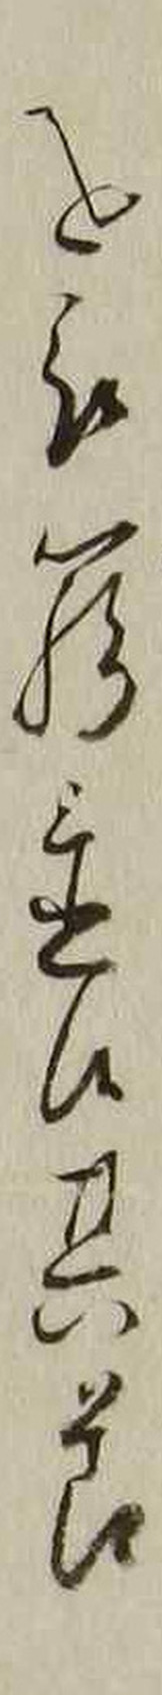を被籠置候其節
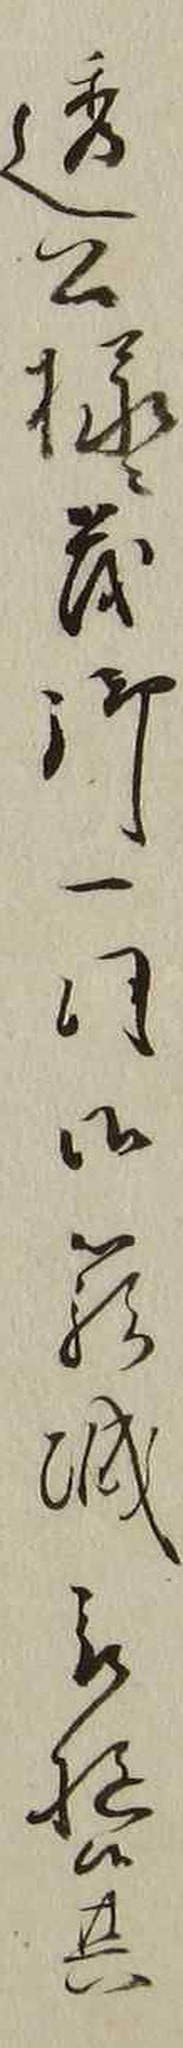透公様ニ茂御一同御籠城被遊其
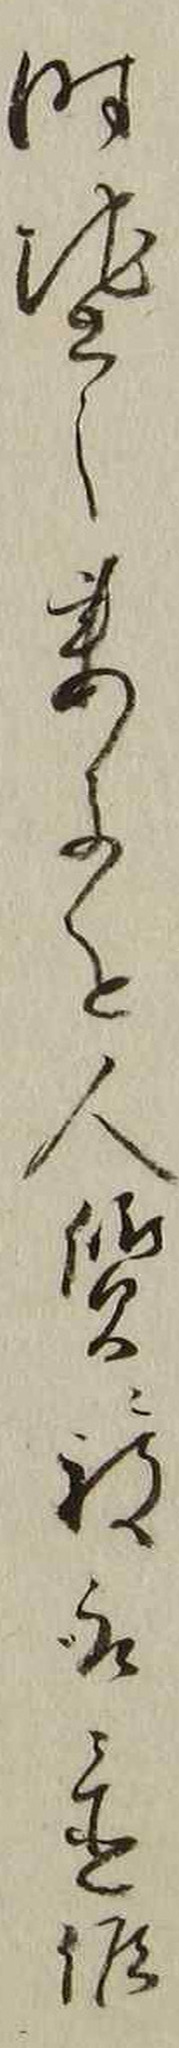時地士之妻子を人質ニ被取置候
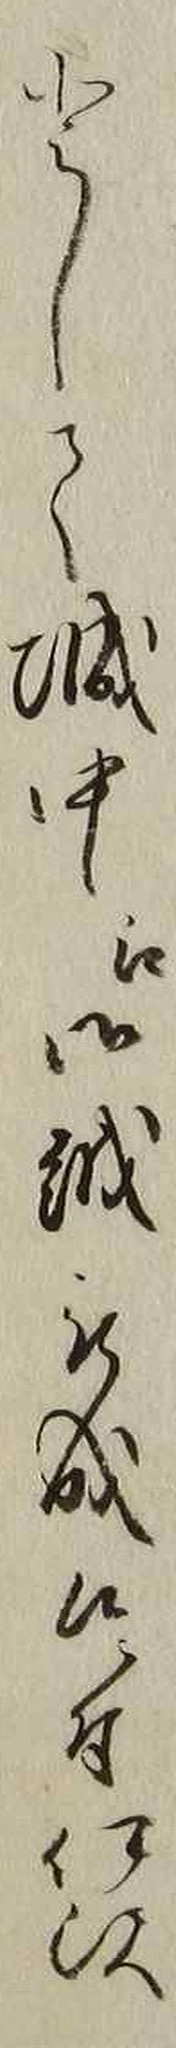として城中江御越被成候ニ付伊沢
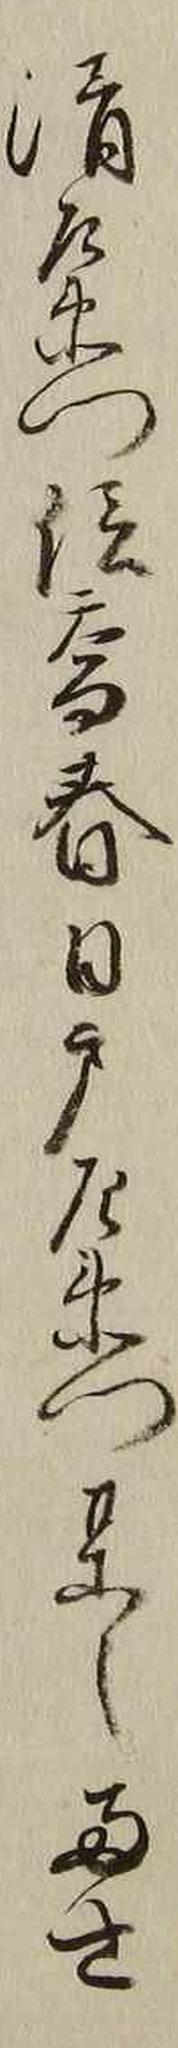清左衛門信喬春日戸左衛門某之両士
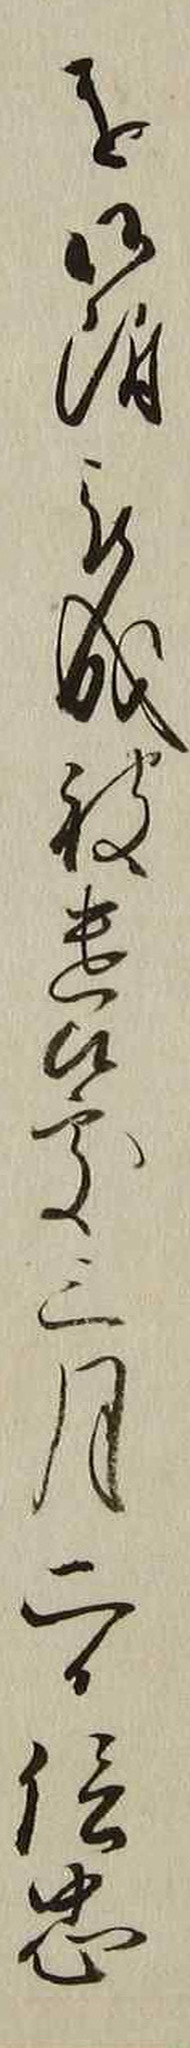を御附被成被遣候處三月二日信忠
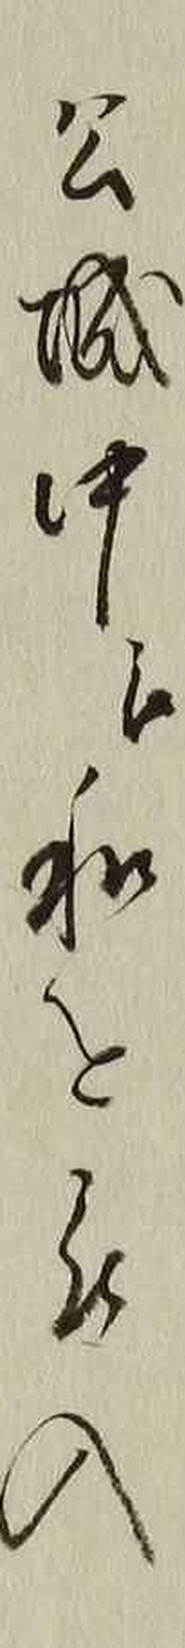公城中江和を被入
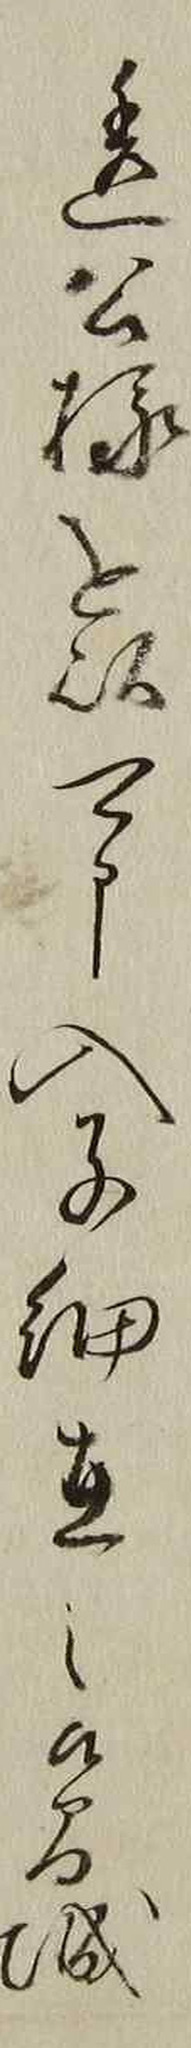透公様を以可申入子細在之候間城
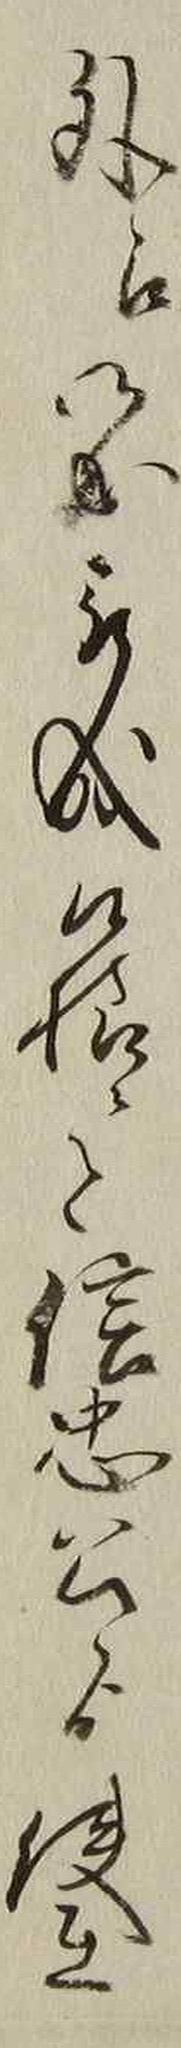外江御出被成候様ニと信忠公ゟ使在
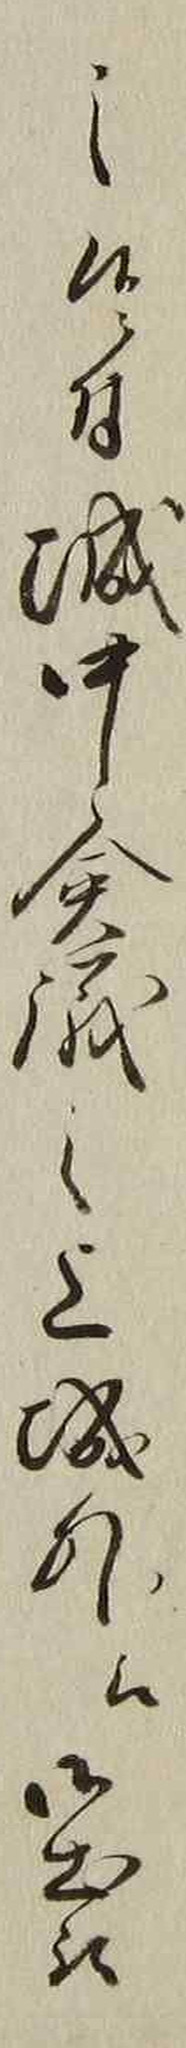之候ニ付城中僉議之上城外江御出被
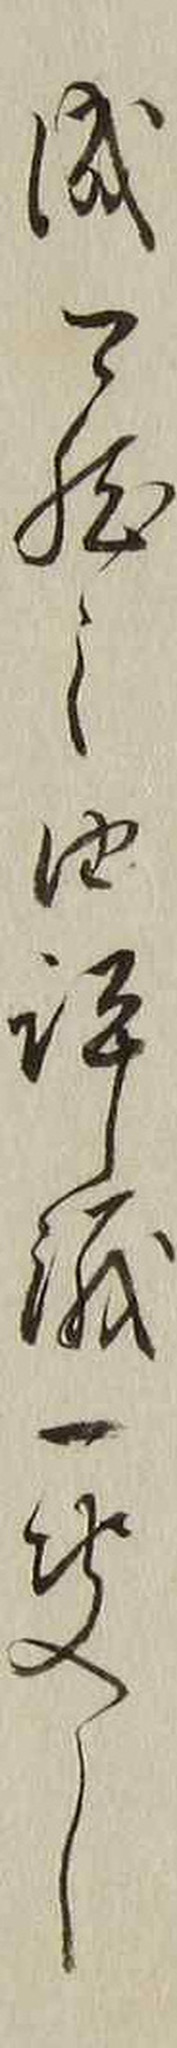成可然之由評議一決し
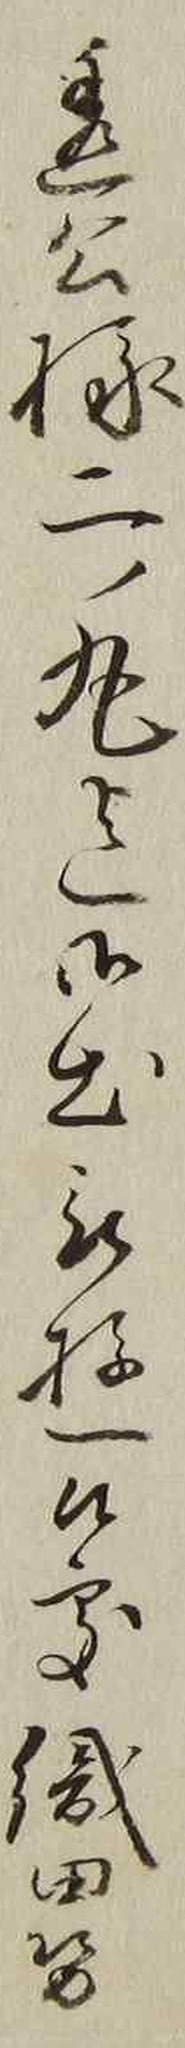透公様二ノ丸迄御出被遊候處織田勢
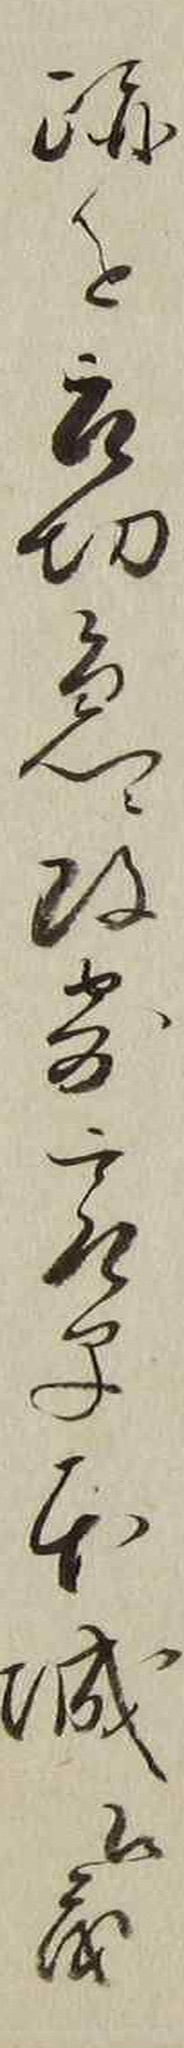跡を被切急ニ改寄最早本城江茂
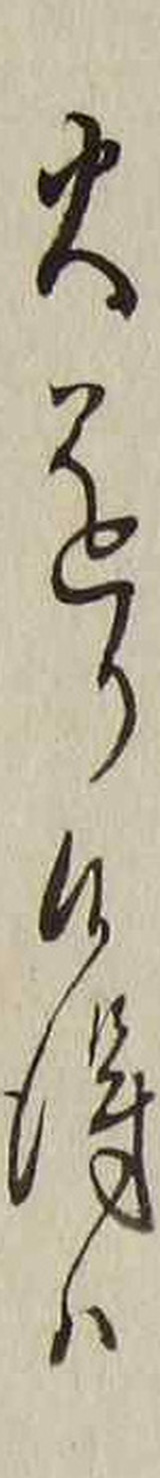火懸り候得ハ
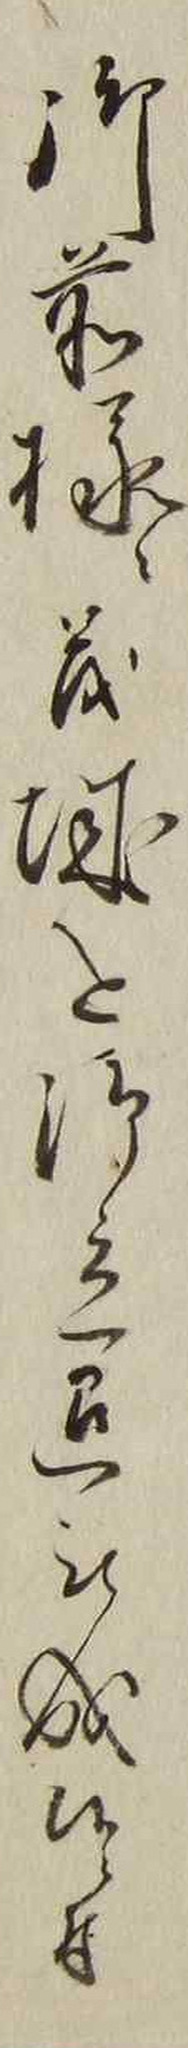御前様ニ茂城を御立退被成候ニ付

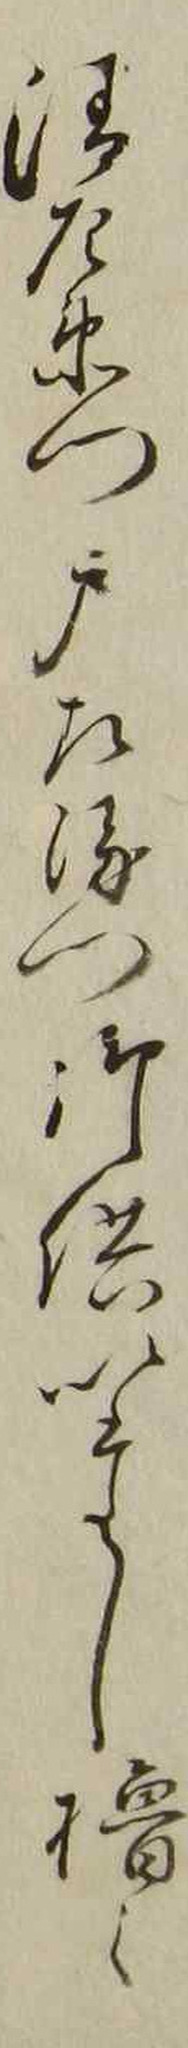清左衛門戸左衛門御供いたし櫓之
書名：諸士系譜　巻之6　い之部6
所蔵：会津若松市立会津図書館
